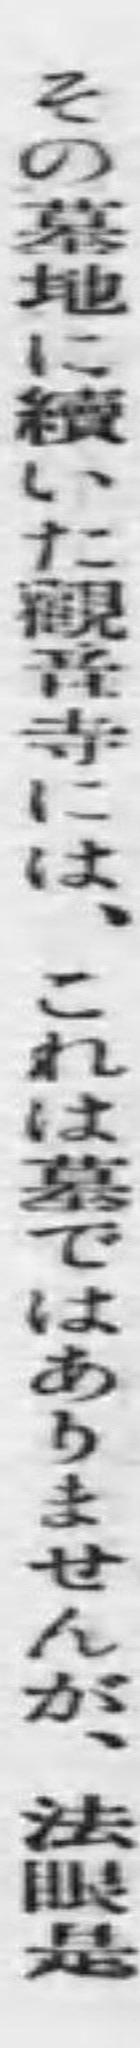その墓地に続いた観音寺には、これは墓ではありませんが、法眼是
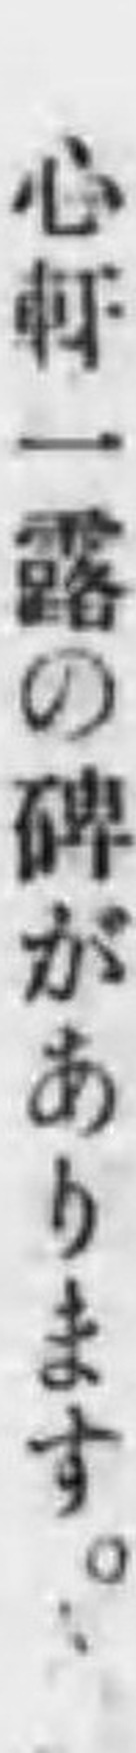心軒一露の碑があります。
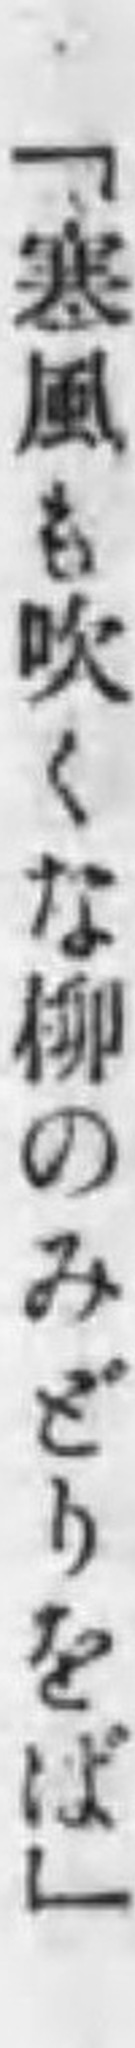「寒風も吹くな柳のみどりをば」

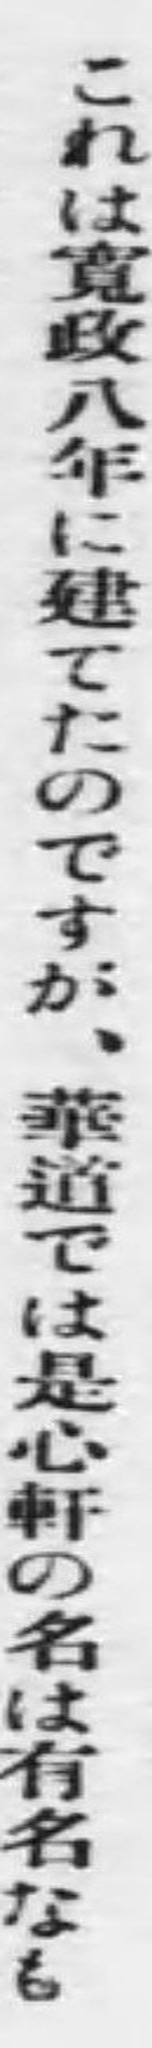これは寛政八年に建てたのですが、華道では是心軒の名は有名なも
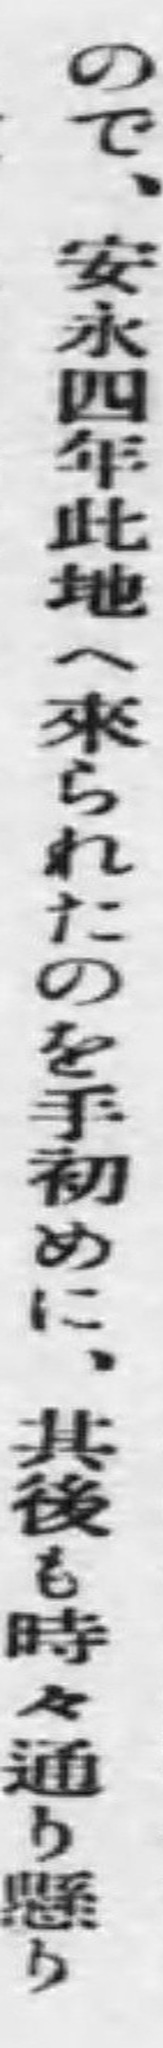ので、安永四年此地へ来られたのを手初めに、其後も時々通り懸り
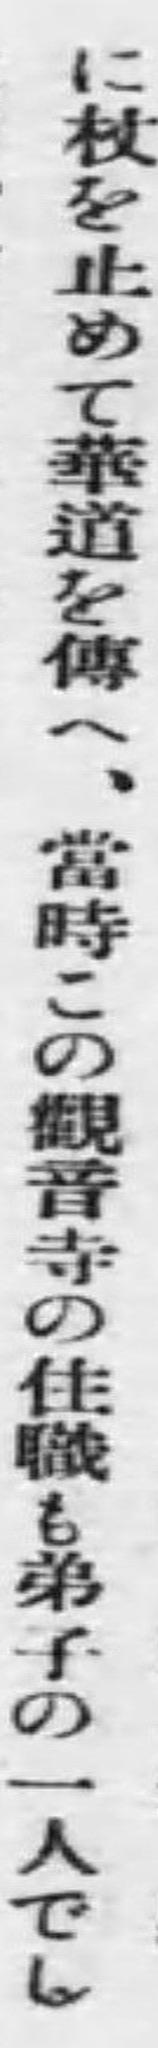に杖を止めて華道を伝へ、当時この観音寺の住職も弟子の一人でし
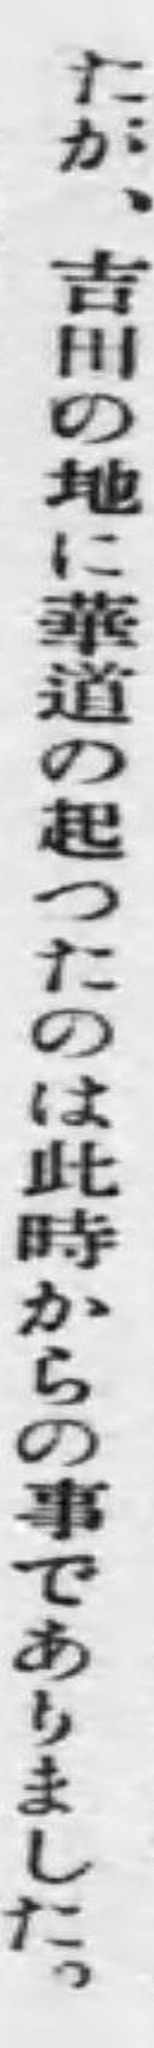たが、吉田の地に華道の起つたのは此時からの事でありました。
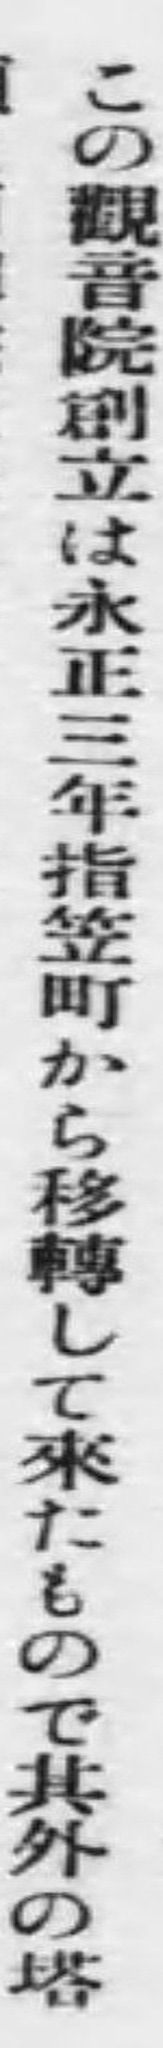この観音院創立は永正三年指笠町から移転して来たもので其外の塔
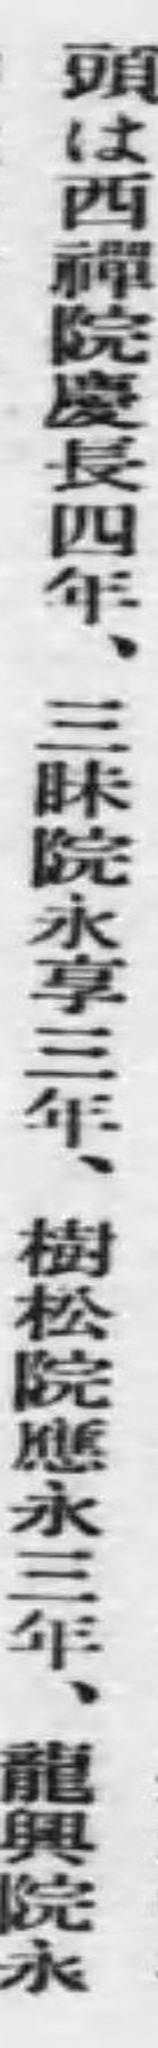頭は西禅院慶長四年、三昧院永享三年、樹松院応永三年、龍興院永
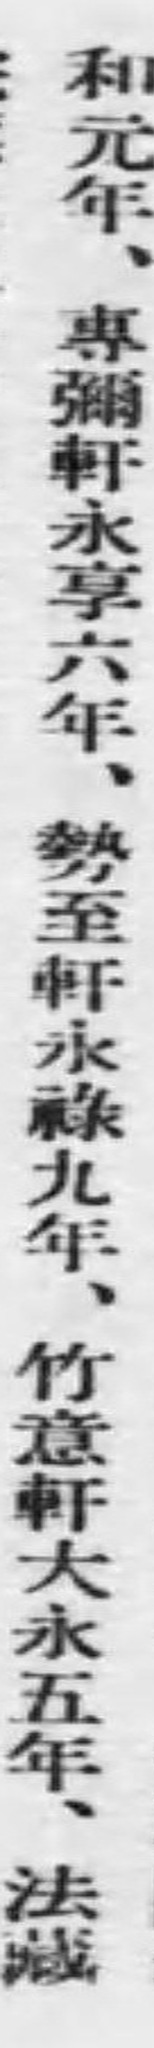和元年、専弥軒永享六年、勢至軒永禄九年、竹意軒大永五年、法蔵
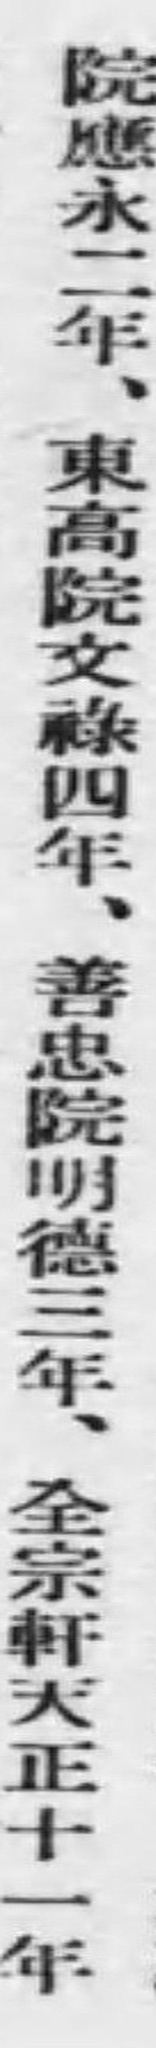院応永二年、東高院文禄四年、善忠院明徳三年、全宗軒天正十一年
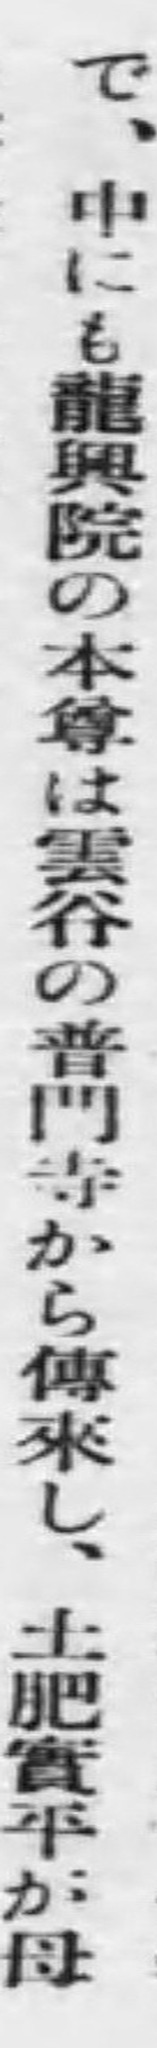で、中にも龍興院の本尊は雲谷の普門寺から伝来し、土肥実平が母
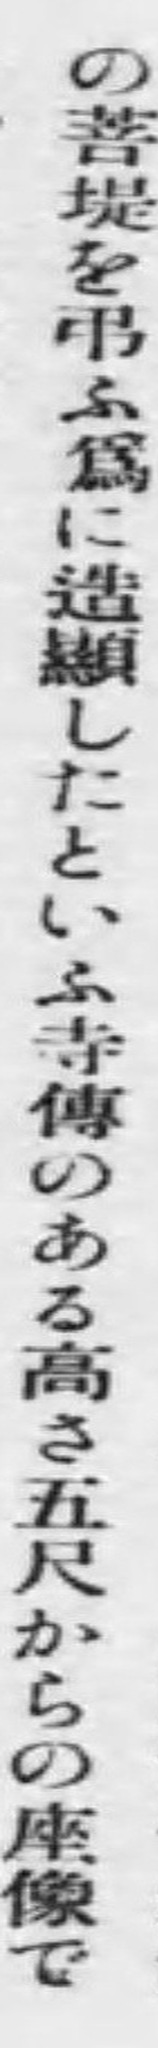の菩堤を弔ふ為に造顕したといふ寺伝のある高さ五尺からの座像で
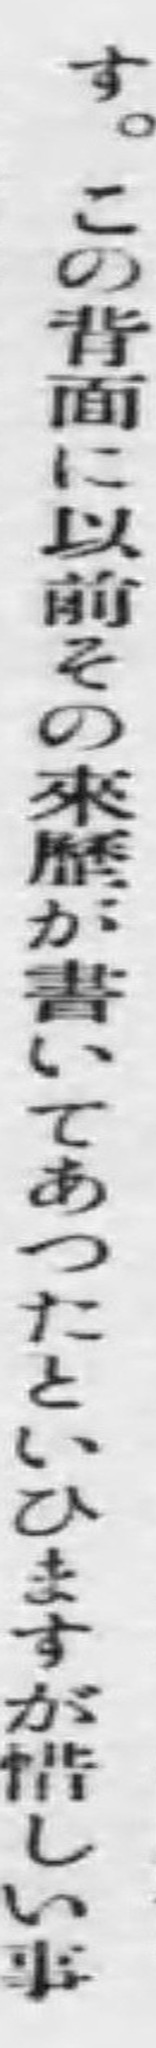す。この背面に以前その来歴が書いてあつたといひますが惜しい事
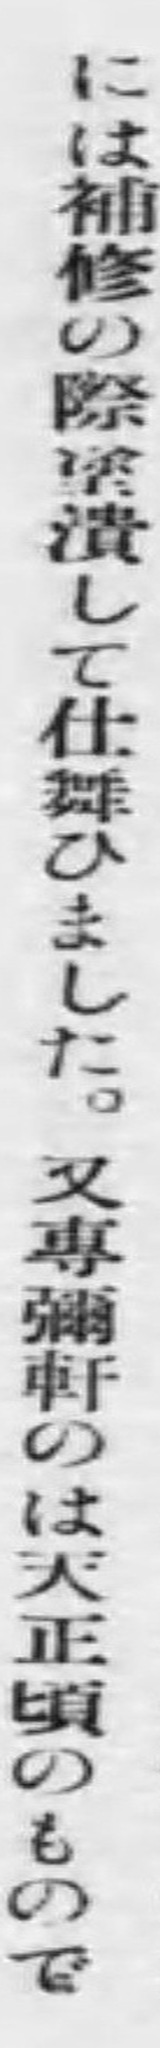には補修の際塗潰して仕舞ひました。又専弥軒のは天正頃のもので
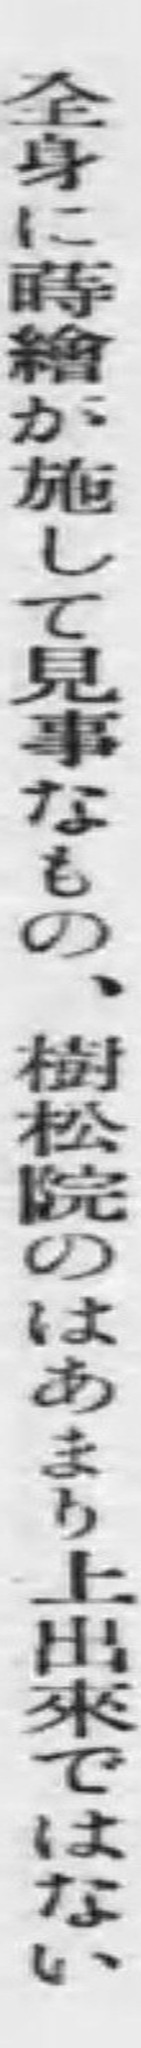全身に蒔絵が施して見事なもの、樹松院のはあまり上出来ではない
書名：東三河道中記 : 豊橋市及其附近案内
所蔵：国立国会図書館 National Diet Library, JAPAN
